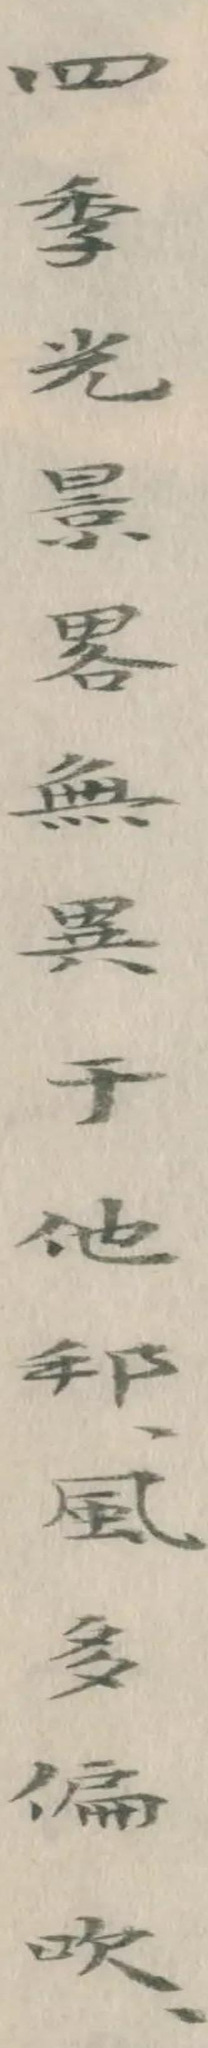四季光景略無異于他邦、風多偏吹、

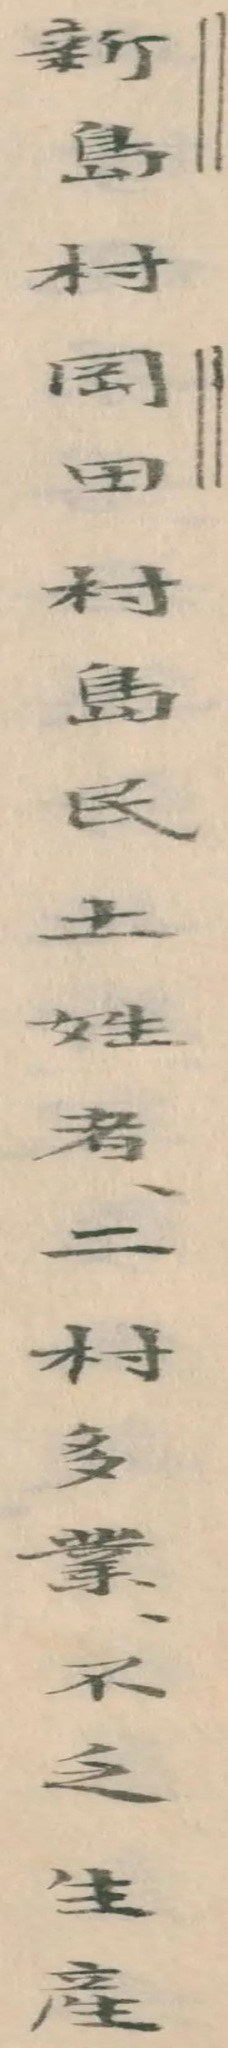新島村岡田村島民土姓者、二村多業、不乏生産
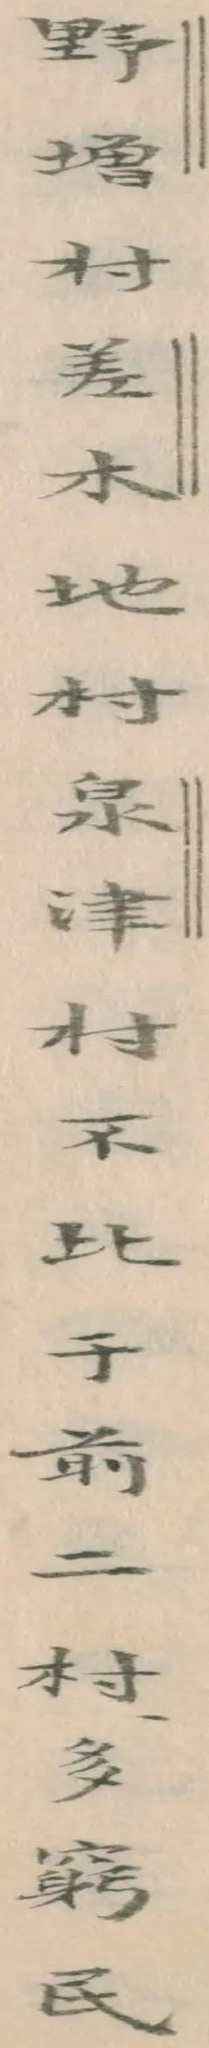野増村差木地村泉津村不比于前二村、多窮民
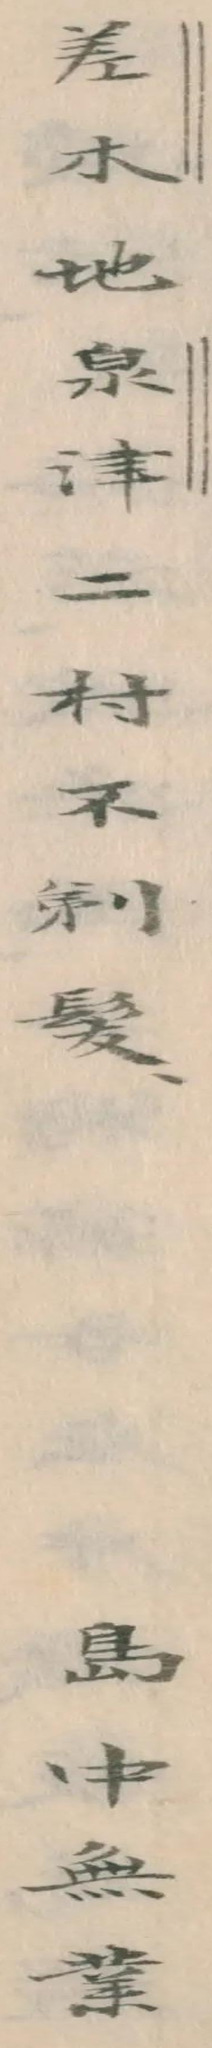差木地泉津二村不剃髪、島中無業
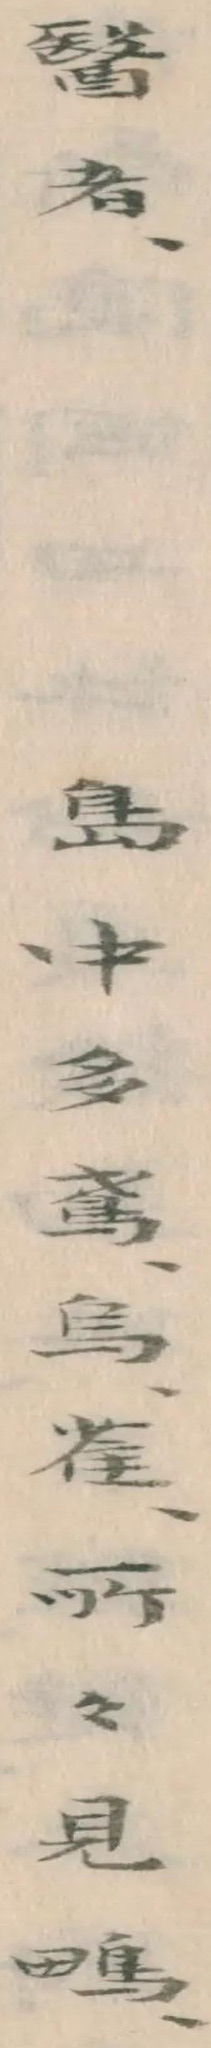医者、島中多鳶、烏、雀、所々見鴫、
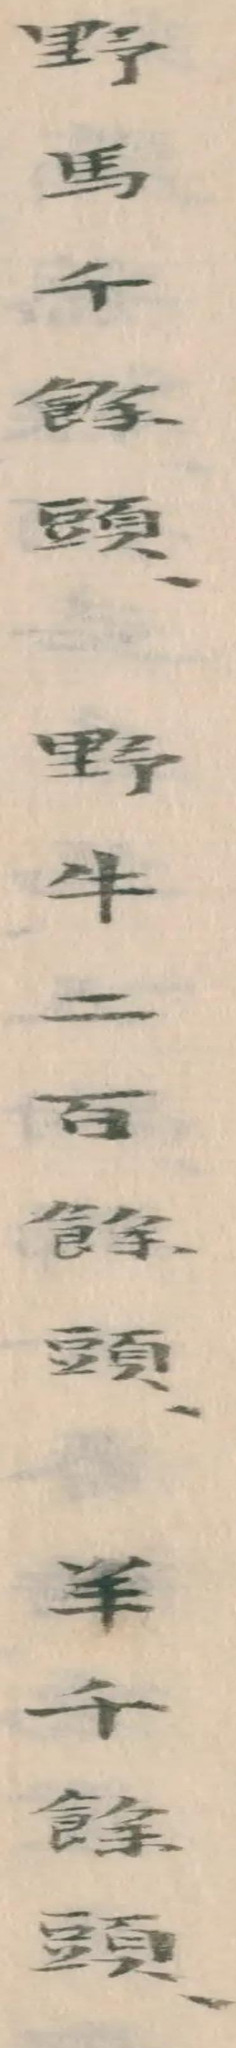野馬千余頭、野牛二百余頭、羊千余頭、

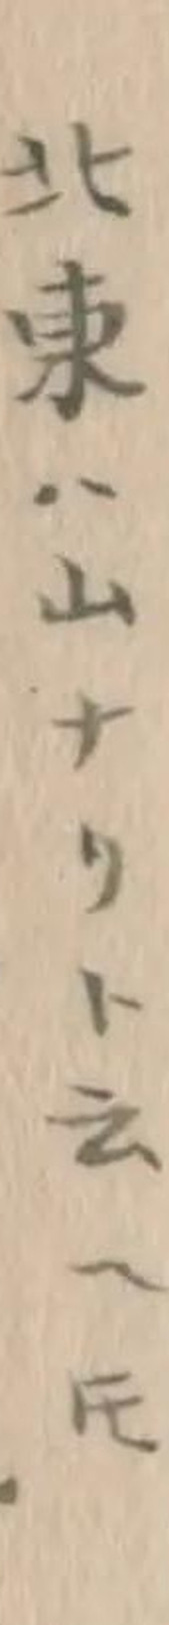北東ハ山ナリト云ヘトモ
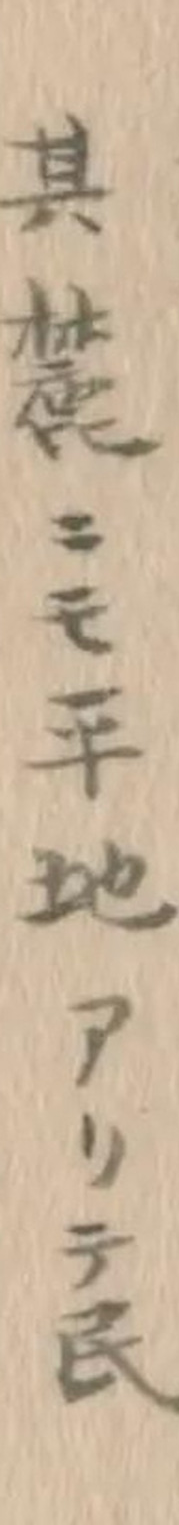其麓ニモ平地アリテ民
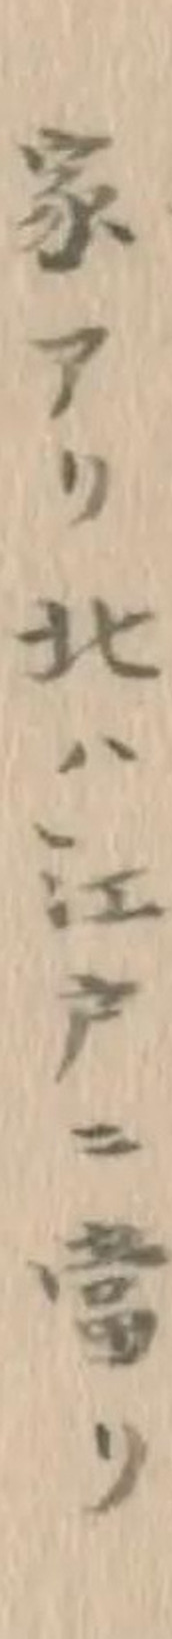家アリ北ハ江戸ニ当リ
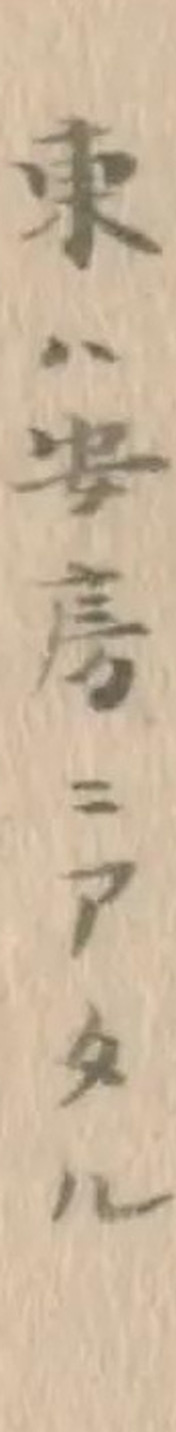東ハ安房ニアタル

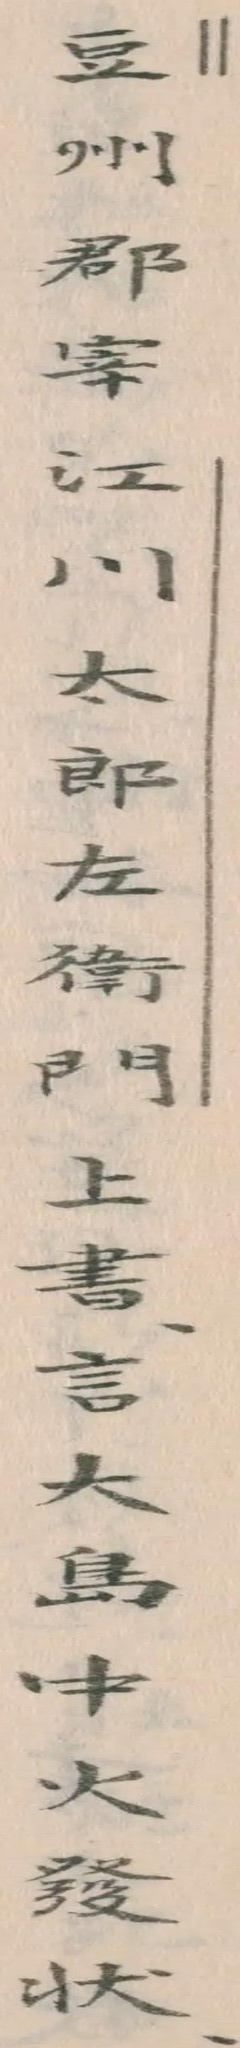豆州郡宰江川太郎左衛門上書、言大島中火発状、
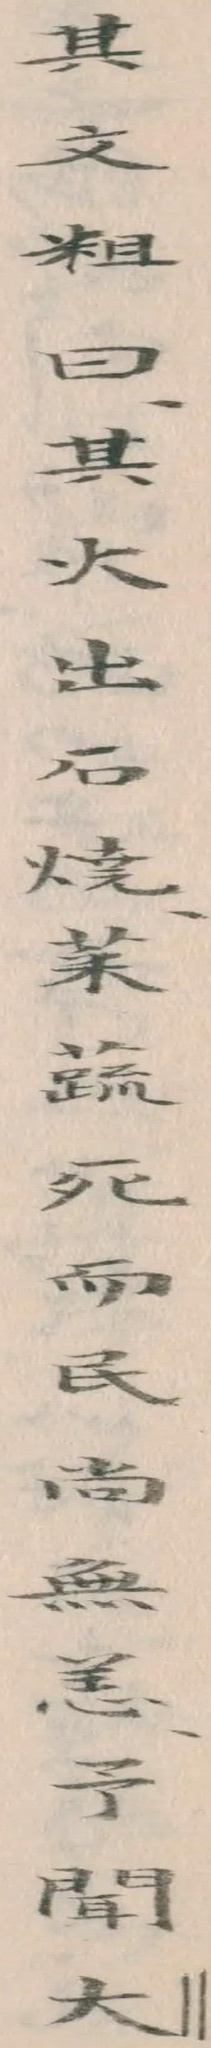其文粗曰、其火出石焼、菜蔬死而民尚無恙予聞大
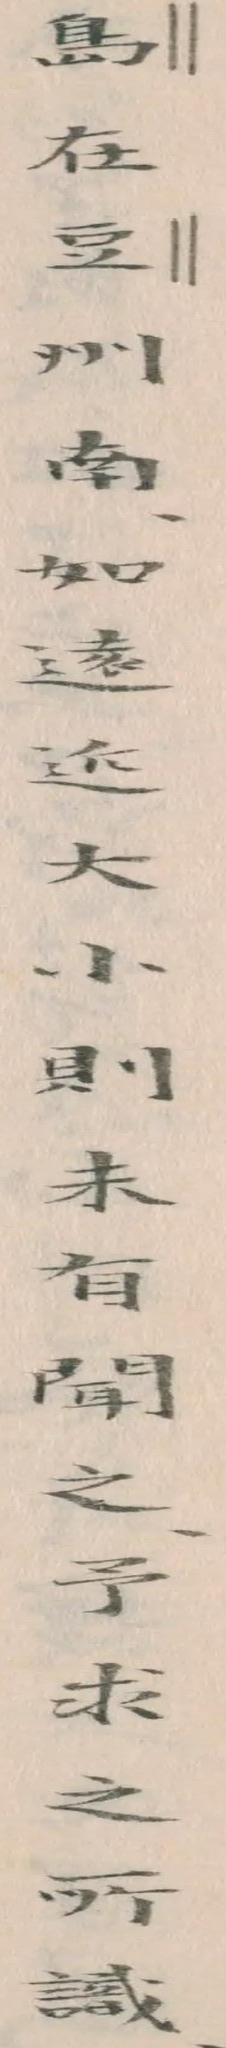島在豆州南、如遠近大小則未有聞之、予求之所識
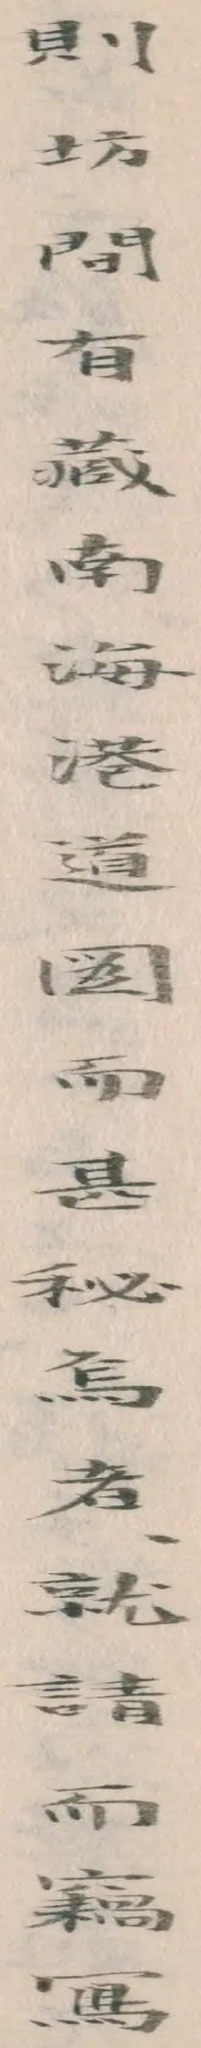則坊間有蔵南海港道図而甚秘焉者、就請而竊写
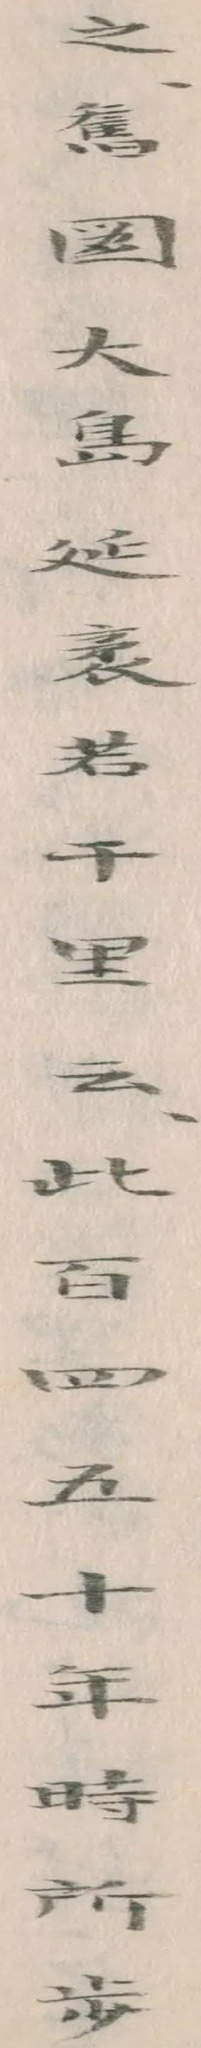之、旧図大島延袤若千里云、此百四五十年時所歩、
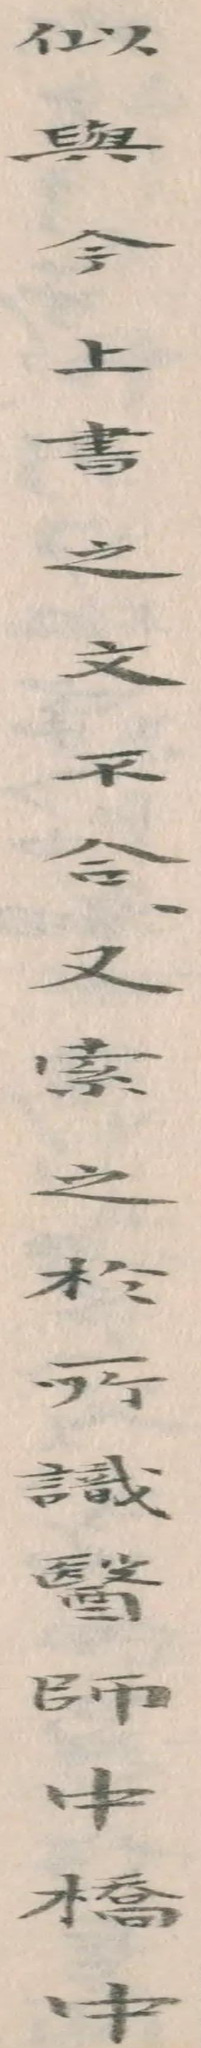似与今上書之文不合、又索之於所識医師中橋中
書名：地災撮要. 巻11-12(地震之部)
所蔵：国立国会図書館 National Diet Library, JAPAN
